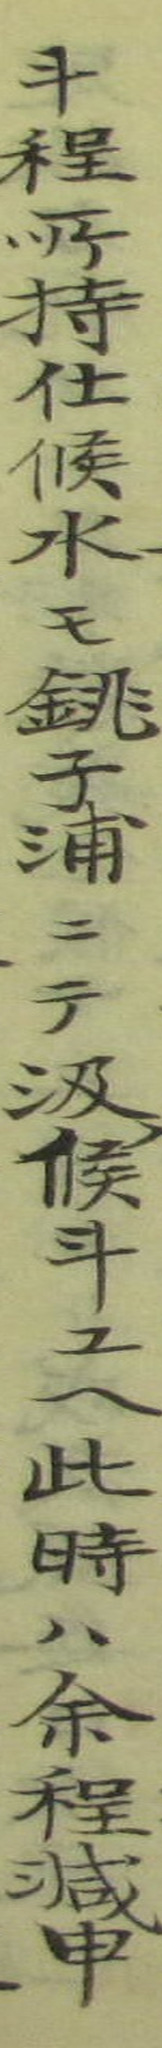斗程所持仕候水モ銚子浦ニテ汲入候斗ユヘ此時ハ余程減申
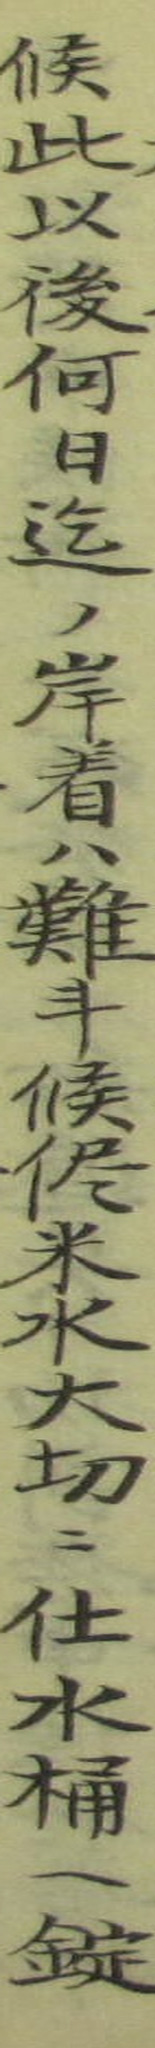候此以後何日迄ノ岸着ハ難斗候侭米水大切ニ仕水桶へ錠
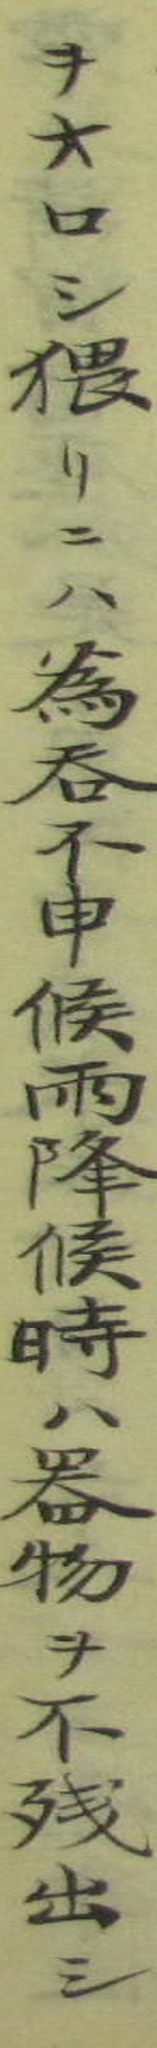ヲオロシ猥リニハ為呑不申候雨降候時ハ器物ヲ不残出シ

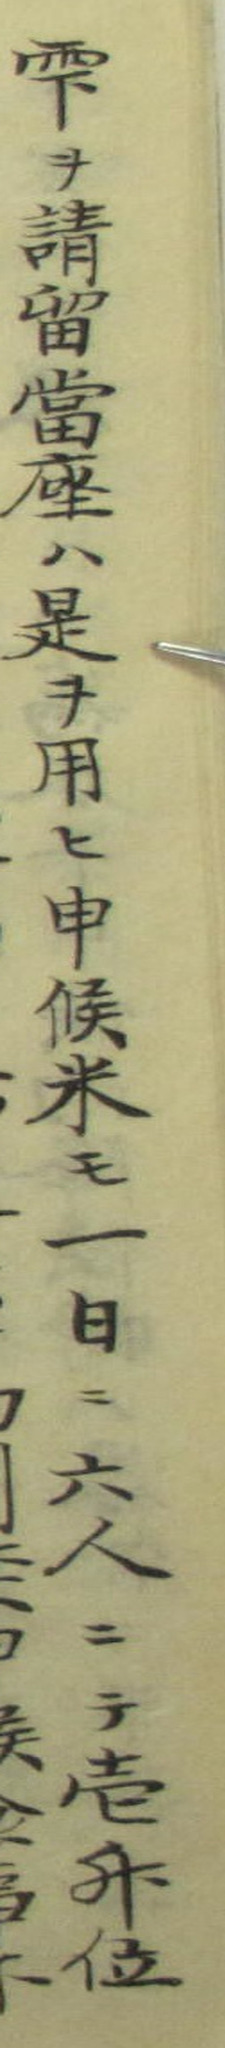雫ヲ請留當座ハ是ヲ用ヒ申候米ヲ一日ニ六人ニテ壱升位
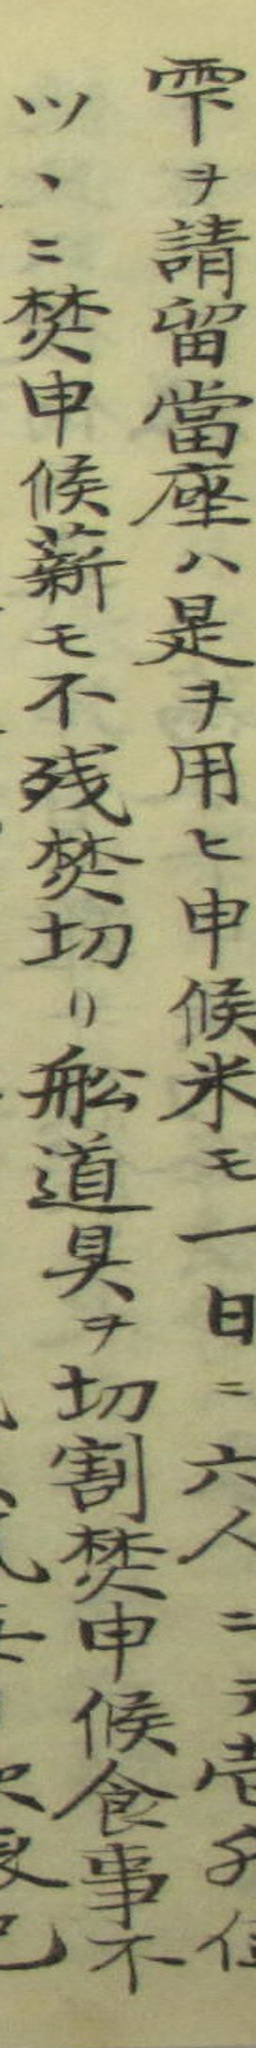ツヽニ焚申候薪モ不残焚切リ舩道具ヲ切割焚申候食事不
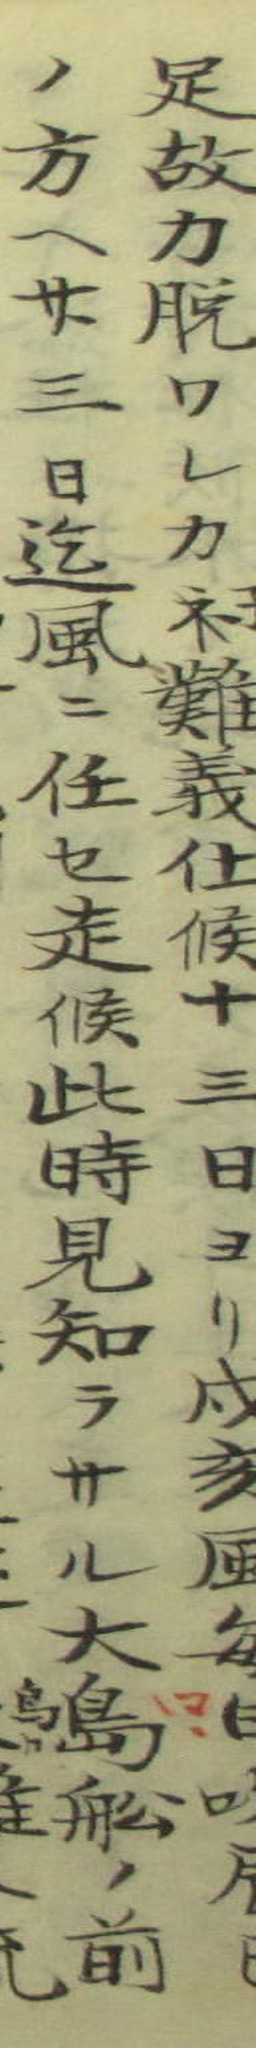ノ方ヘ廿三日迄風ニ任セ走候此時見知ラサㇽ大島舩ノ前
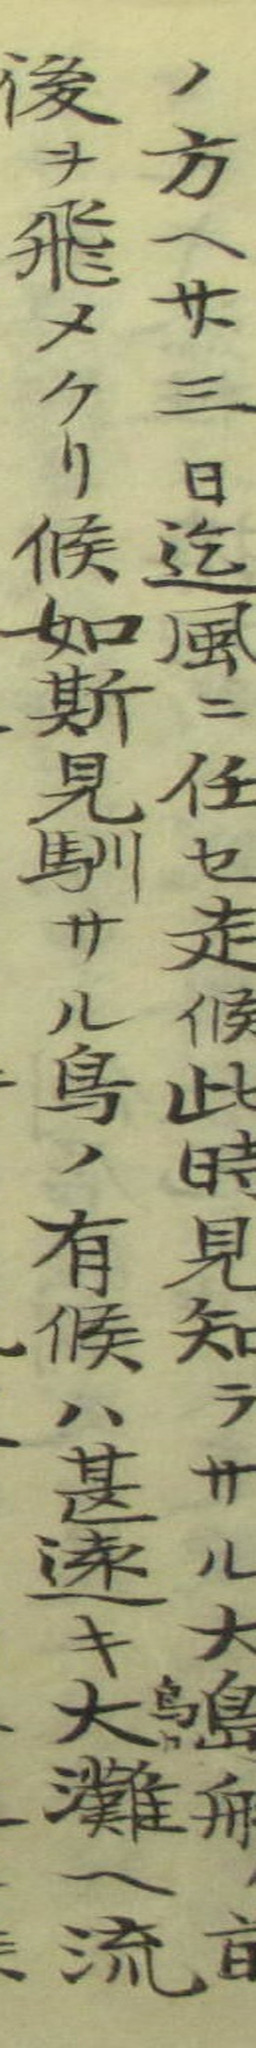後ヲ飛メクリ候如斯見馴サル鳥ノ有候ハ甚速キ大灘ヘ流
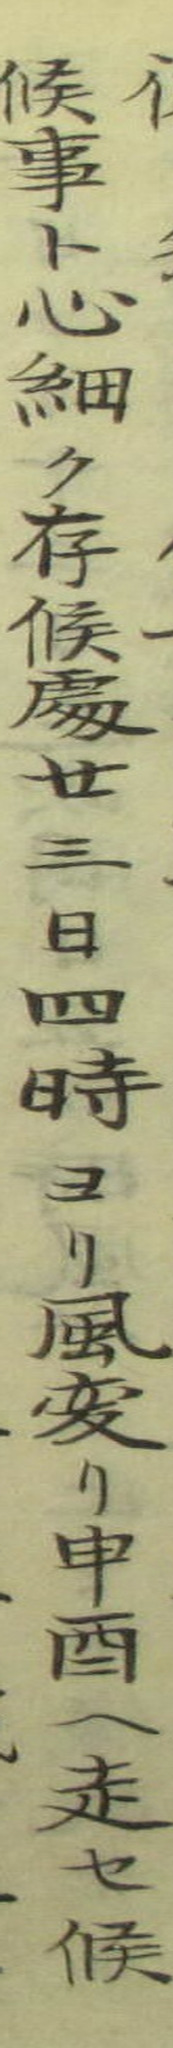候事ト心細ク存候處廿三日四時ヨリ風変リ申酉へ走セ候
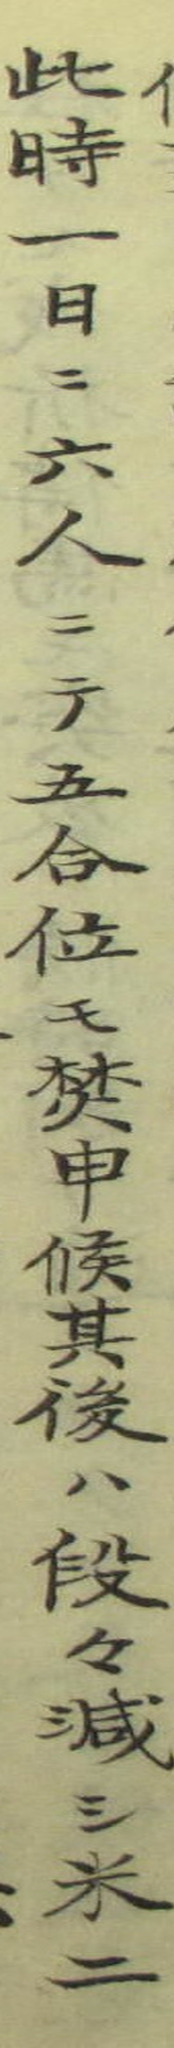此時一日ニ六人ニテ五合位モ焚申候其後ハ段々減シ米二
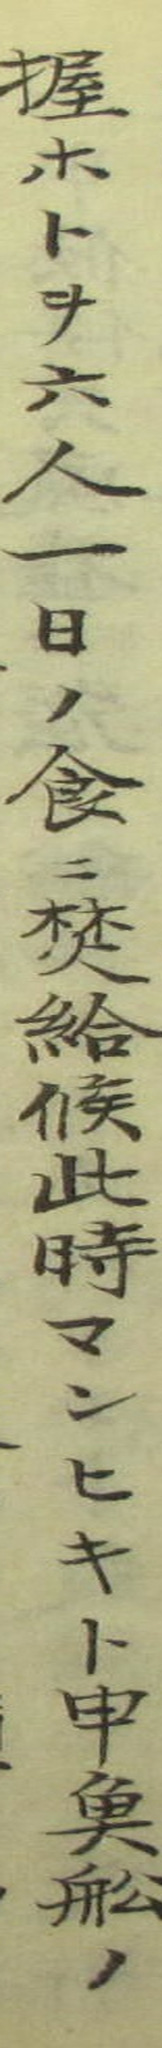握ホトヲ六人一日ノ食ニ焚給候此時マンヒキト申魚舩ノ
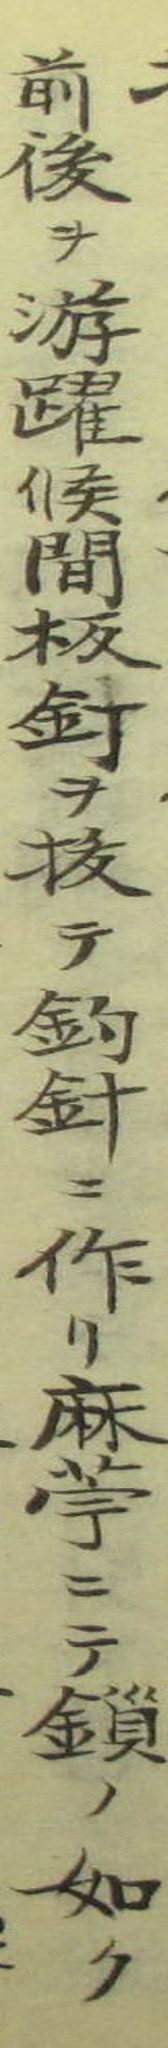前後ヲ游躍候間板針ヲ抜テ釣針ニ作リ麻苧ニテ鎖ノ如く
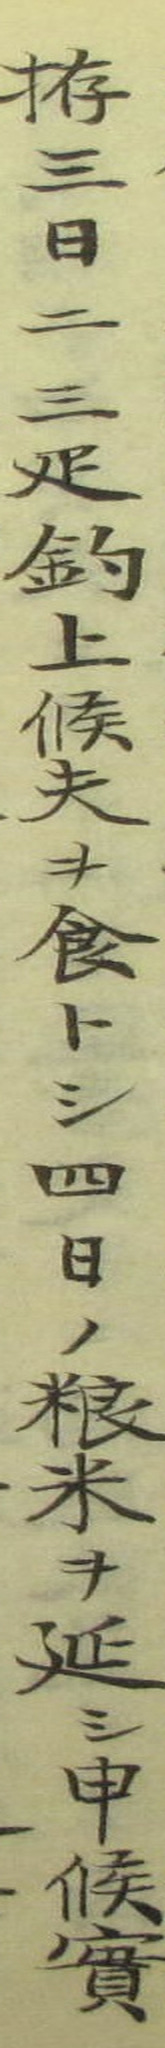拵三日二三疋釣上候夫ヲ食トシ四日ノ粮米ヲ延シ申候實
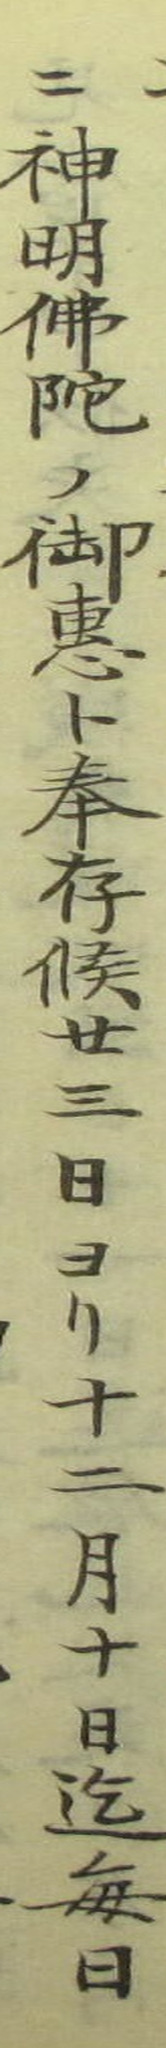ニ神明佛陀ノ御恵ト奉存候廿三日ヨリ十二月十日迄毎日
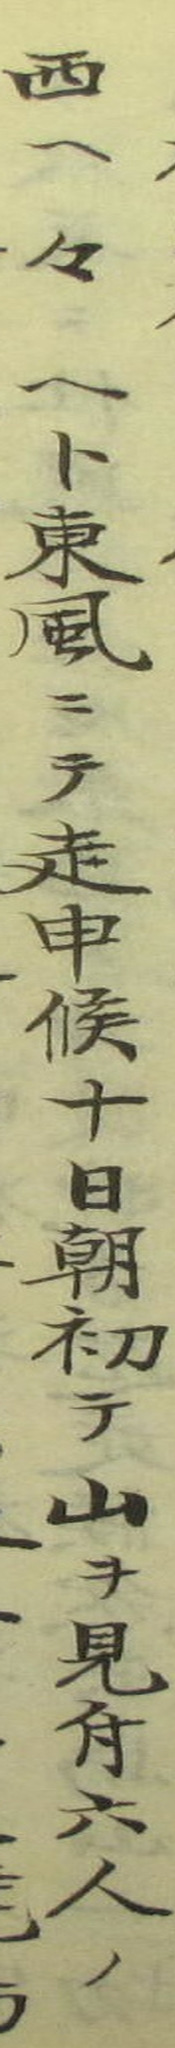西ヘ々ヘト東風ニテ走申候十日朝初テ山ヲ見付六人ノ
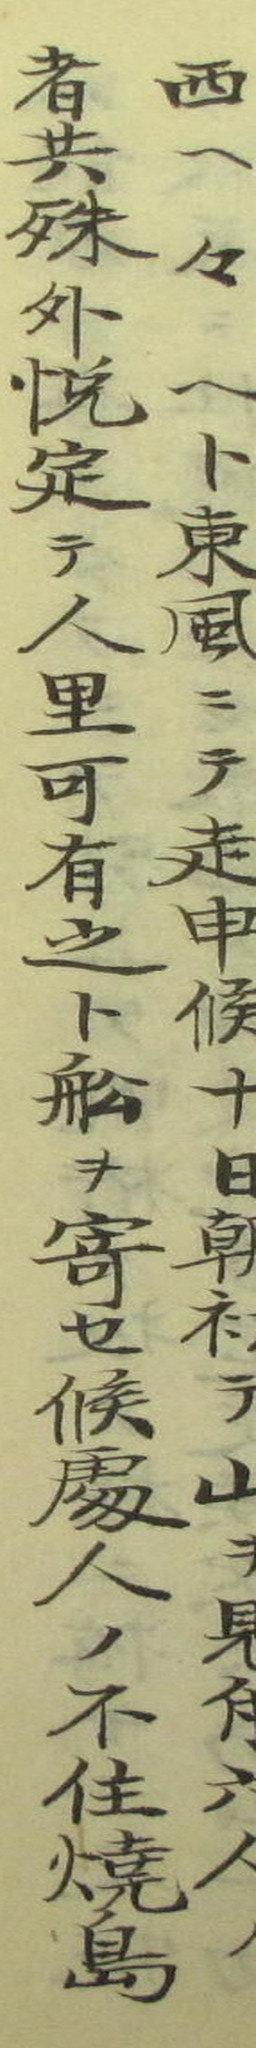者共殊外悦定テ人里可有之ト舩ヲ寄セ候處人ノ不住焼島
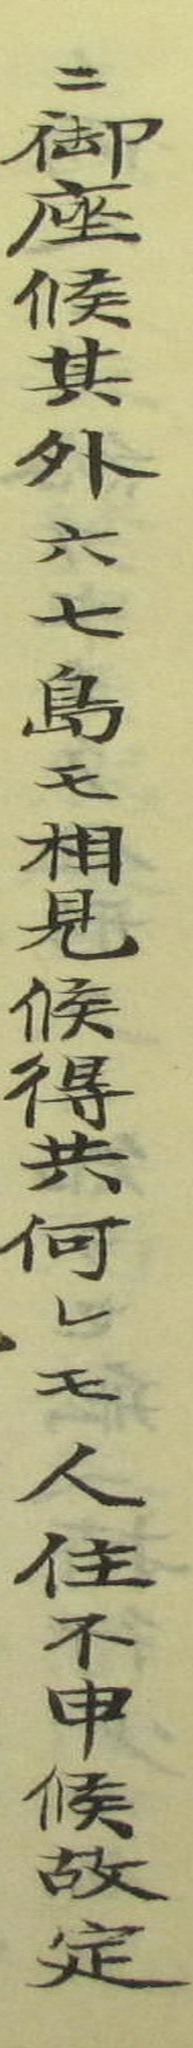ニ御座候其外六七島モ相見候得共何レモ人住不申候故定
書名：異国船漂着記 外二
